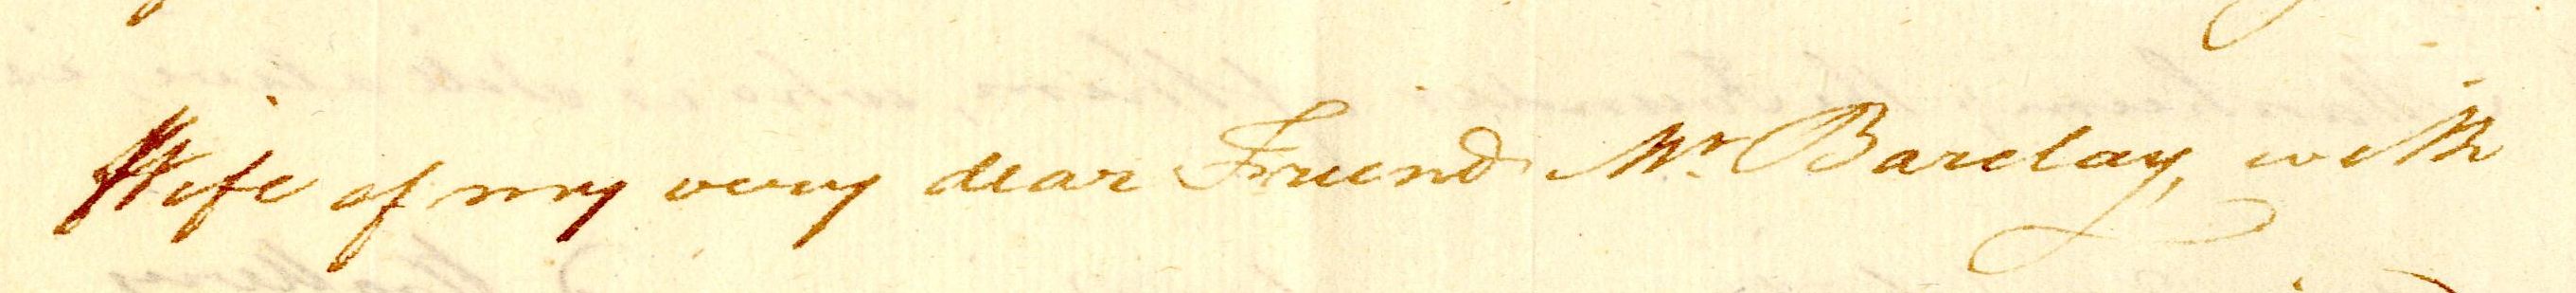Wife of my very dear Friend M^r. Barclay, with
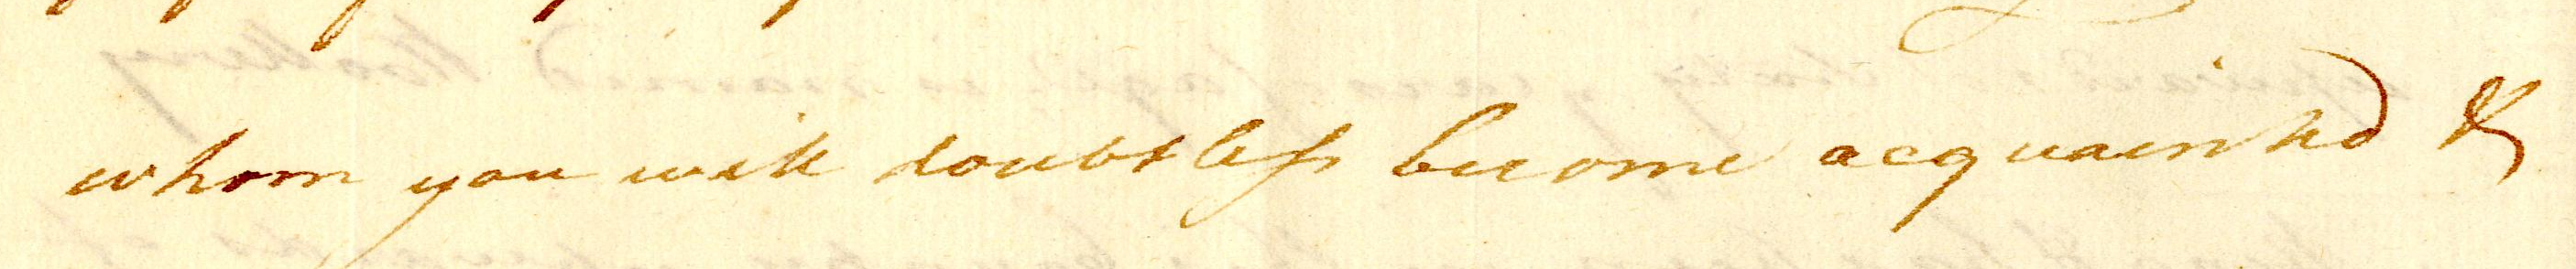whom you will doubtless become acquainted &
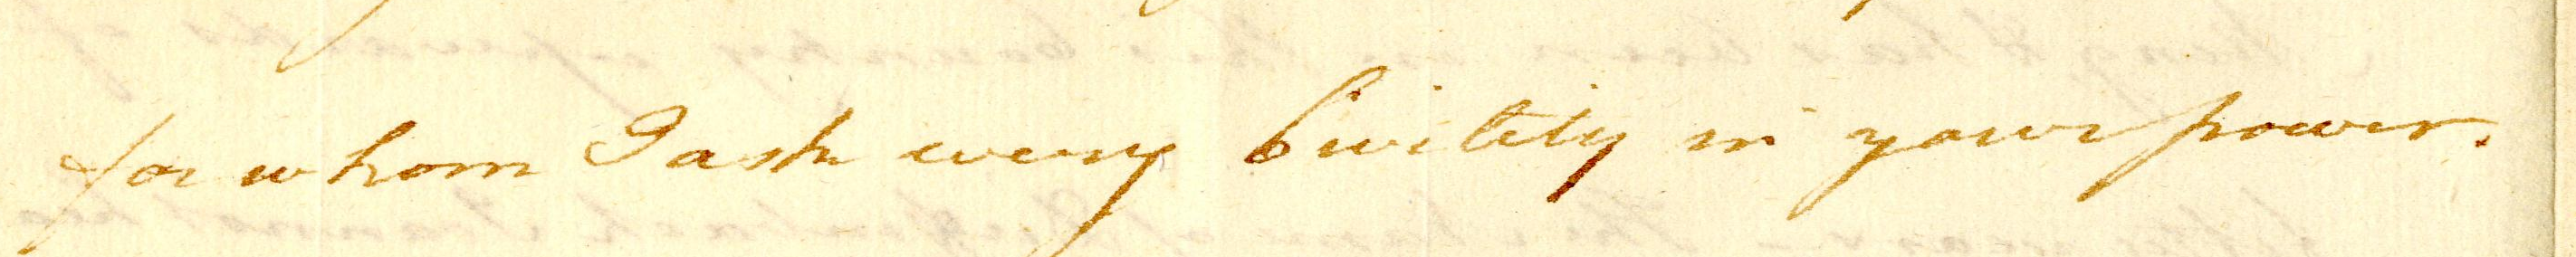for whom I ask every Civility in your power.
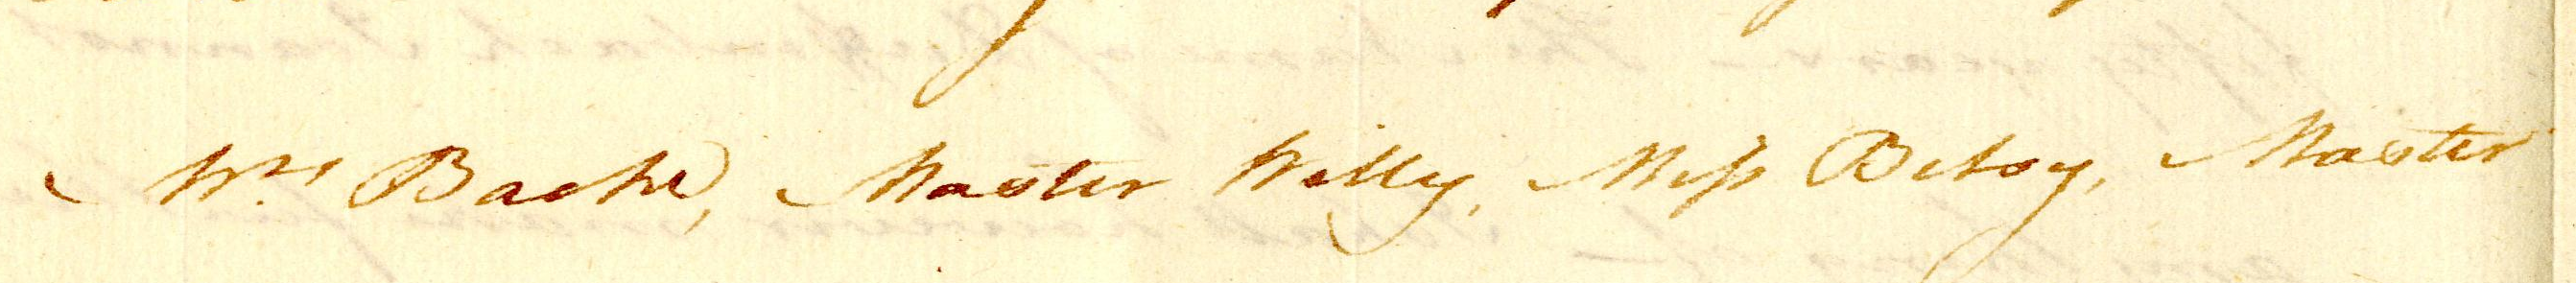M^rs. Bache, Master Willy, Miss Betsy, Master
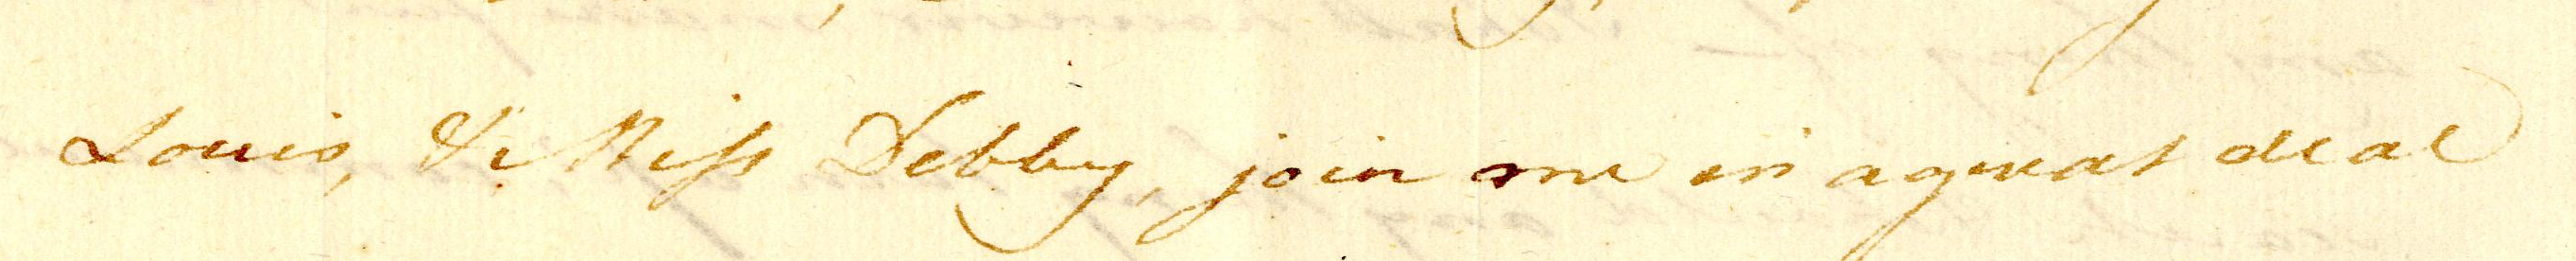Lewis, & Miss Debby join me in a great deal
